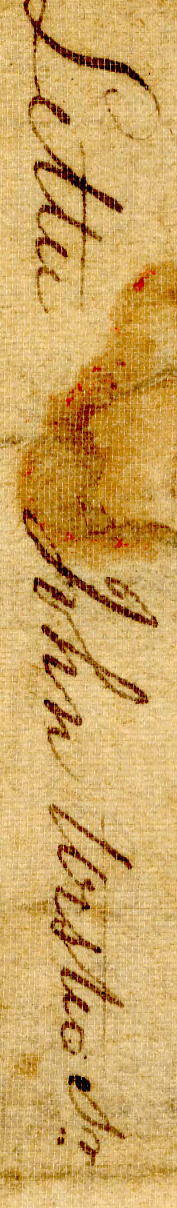Letter John Wister S^r.
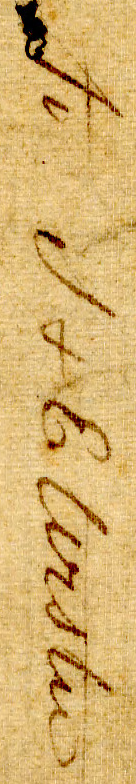to J & E Wister
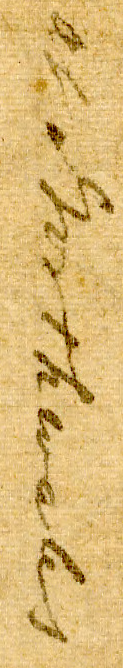at Northwales
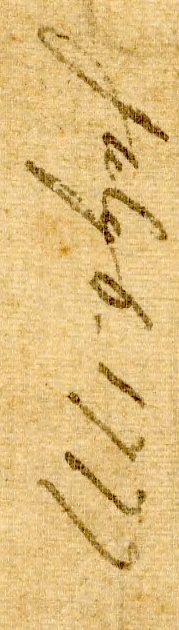July 6. 1777
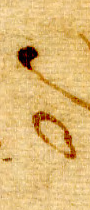To
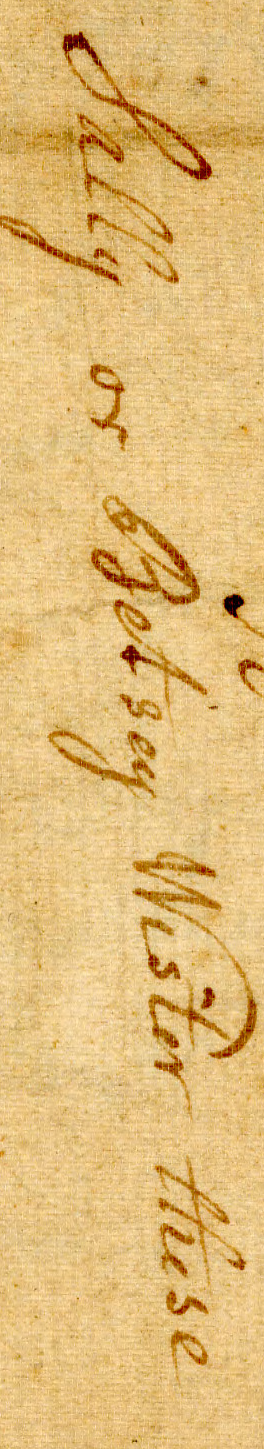Sally or Betsey Wister these
